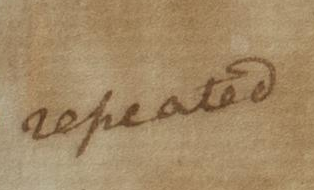repeated
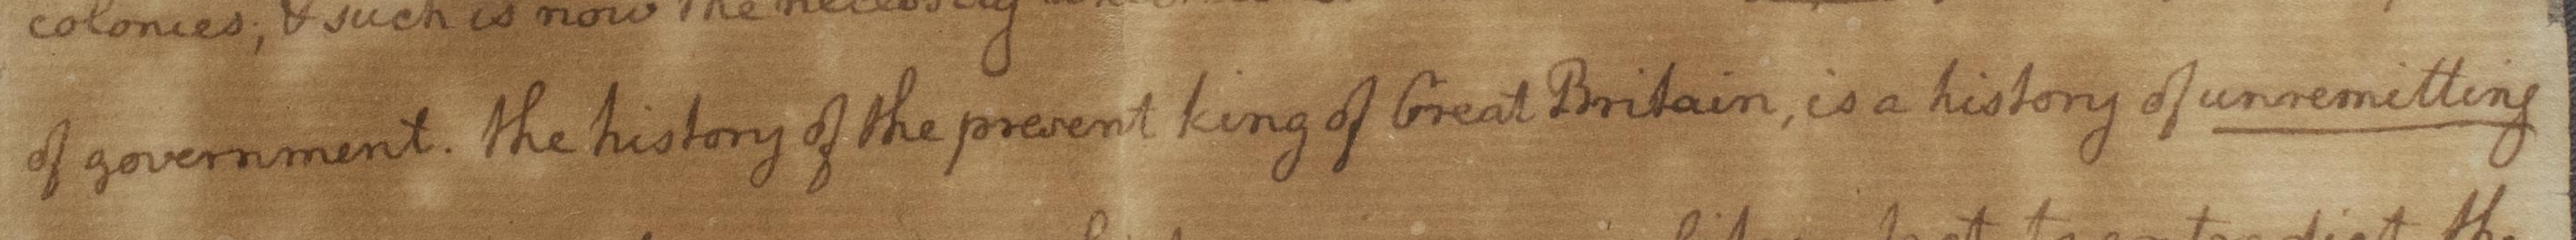of government. The history of the present King of Great Britain is a history of unremitting
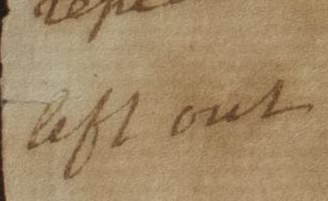left out
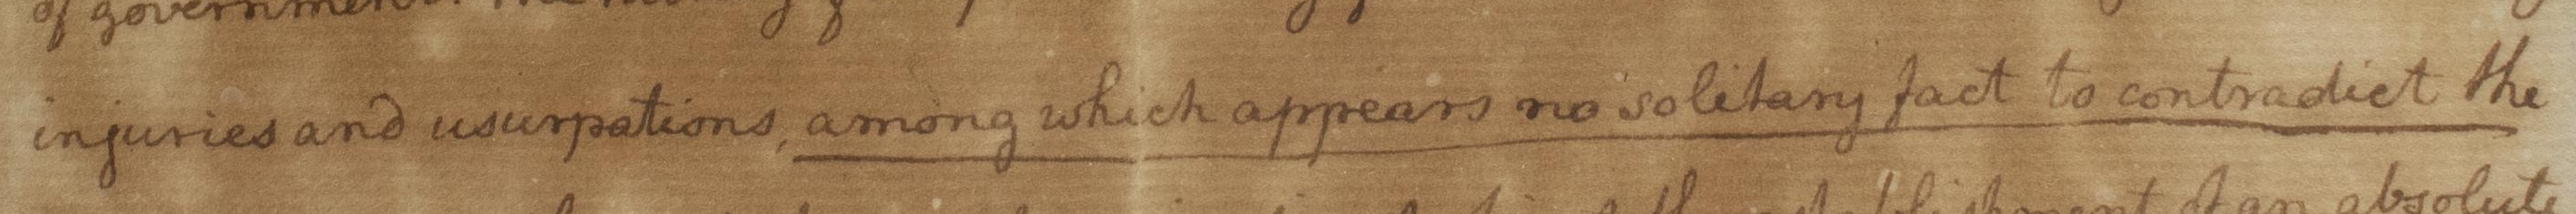injuries and usurpations, among which appears no solitary fact to contradict the
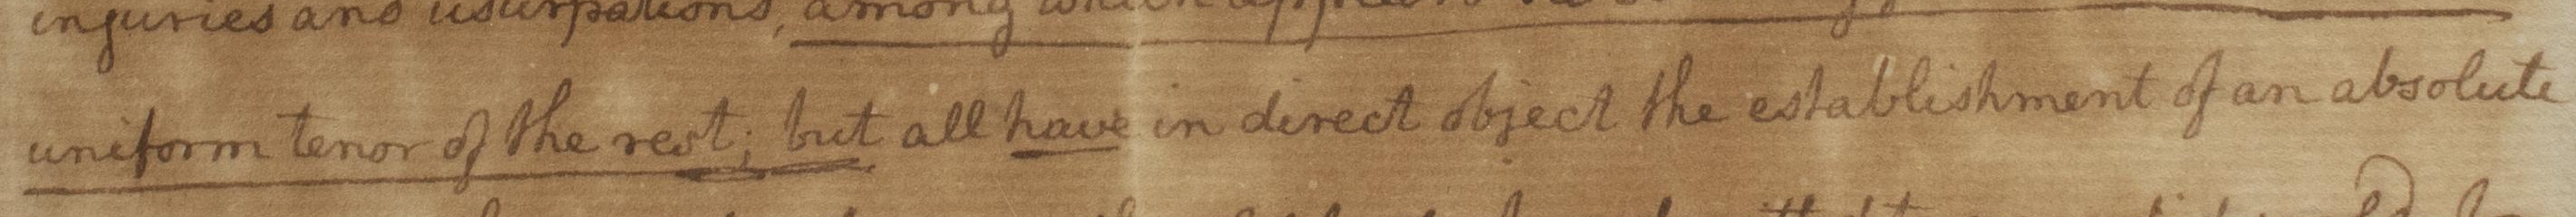uniform tenor of the rest, but all have in direct object the establishment of an absolute
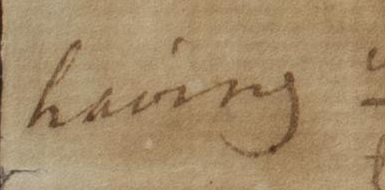having
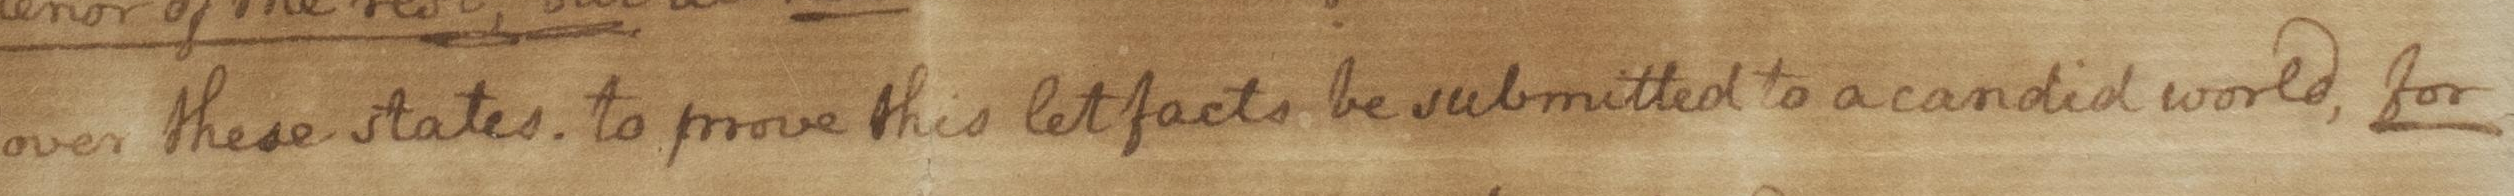over these states, to prove this let facts be submitted to a candid world, for
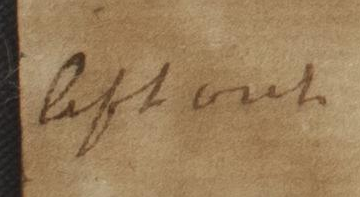left
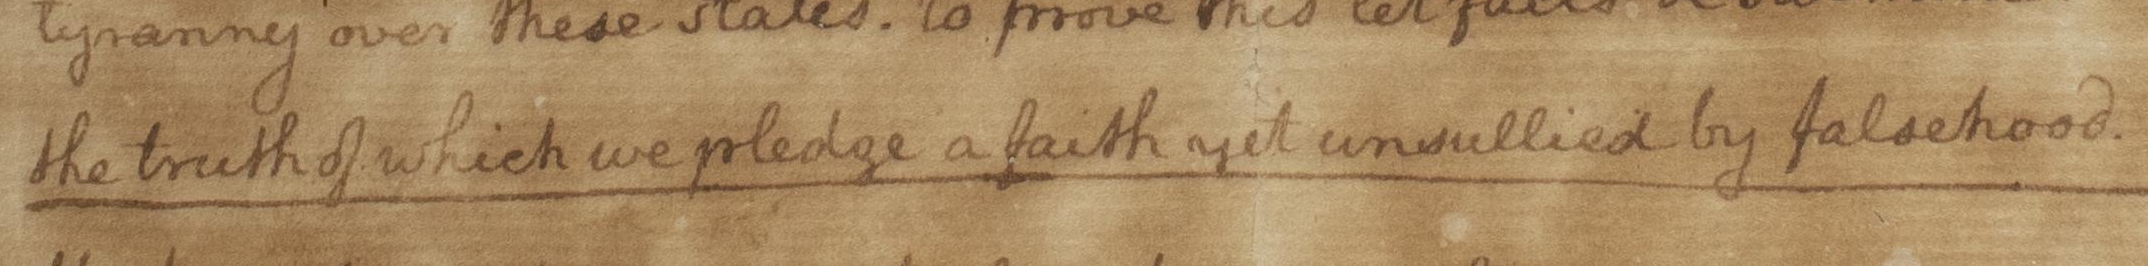the truth of which we pledge a faith yet unsullied by falsehood
